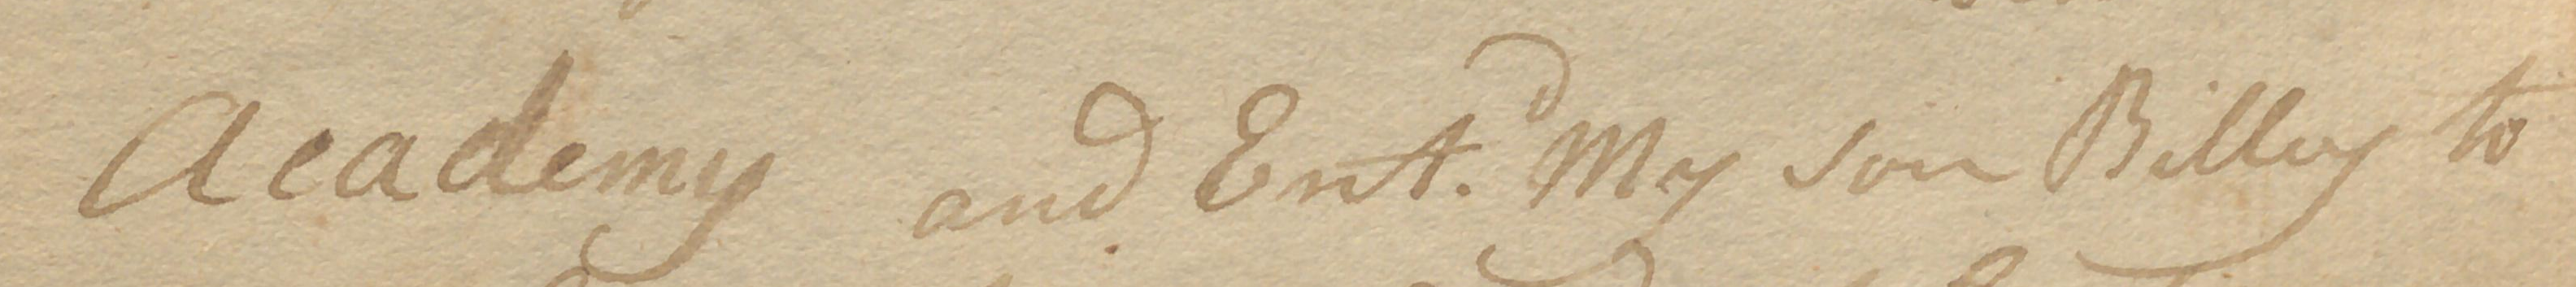Academy and Ent^d. My son Billey to
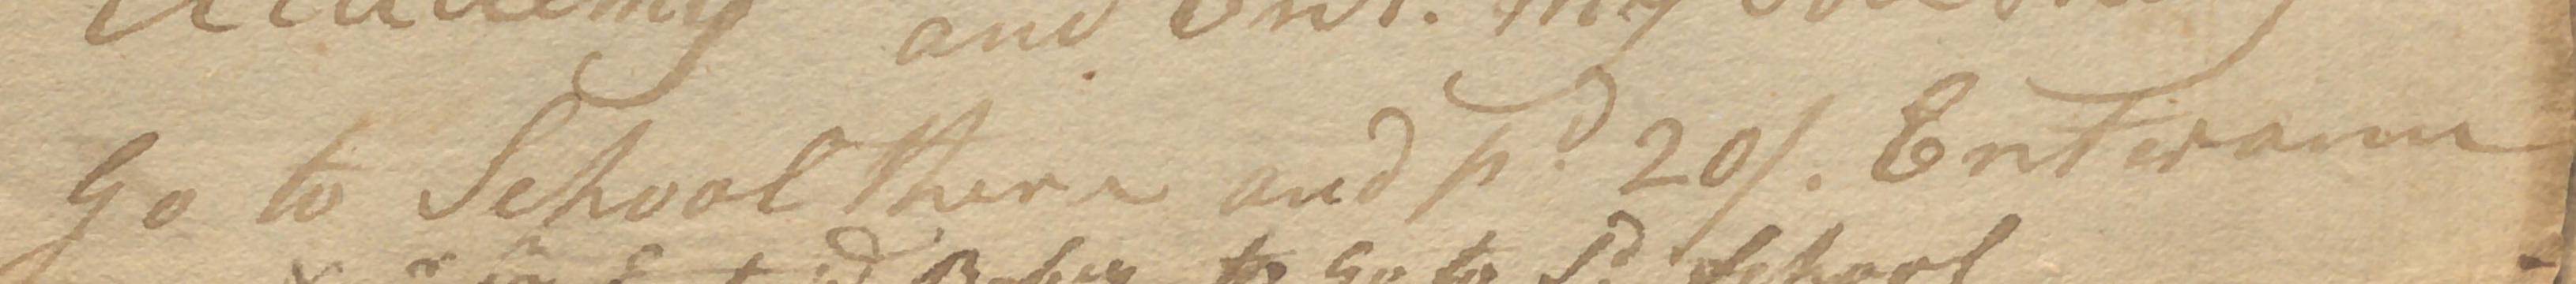Go to School there and p^d. 28^s. Entrance
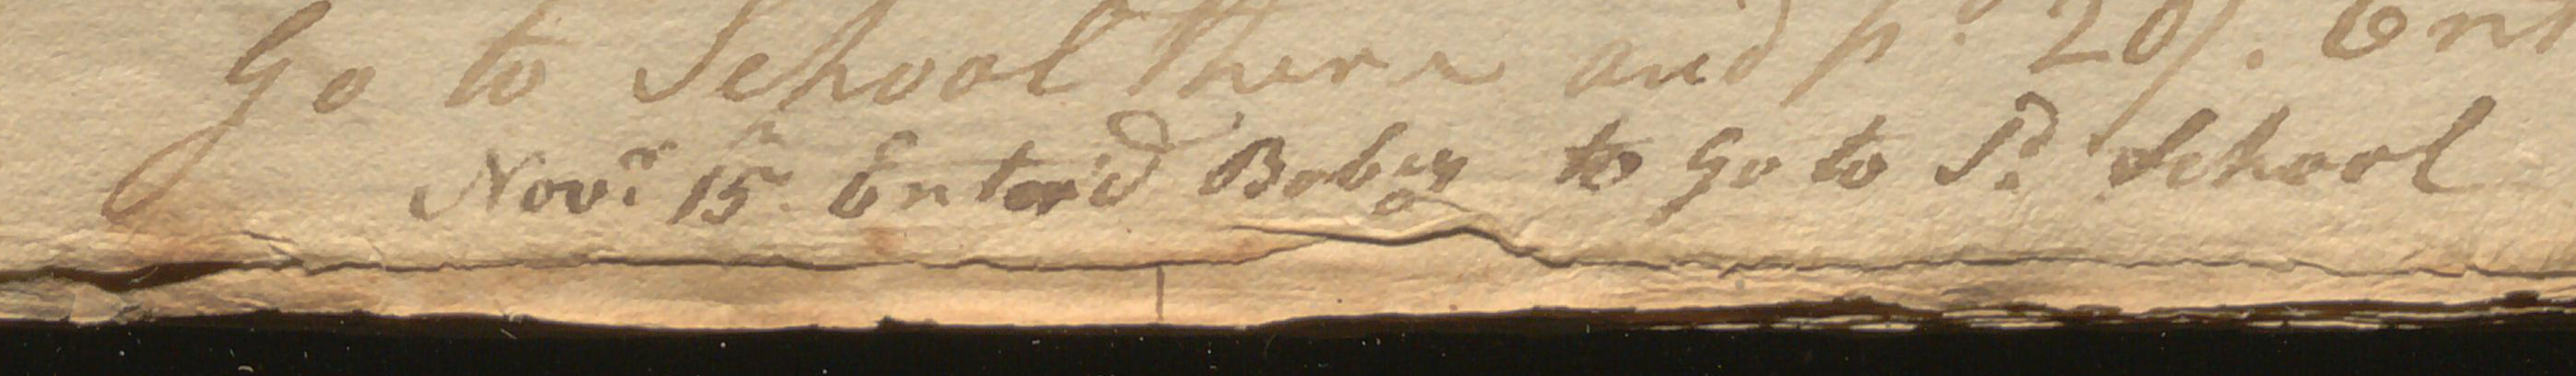Nov^r. 15th Enter'd Bobaey to go to s^d. School
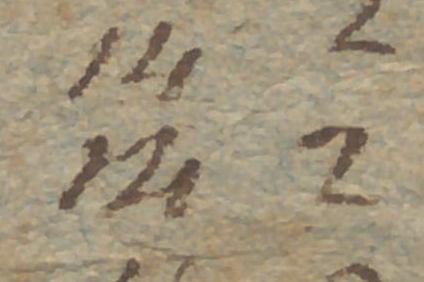14 2
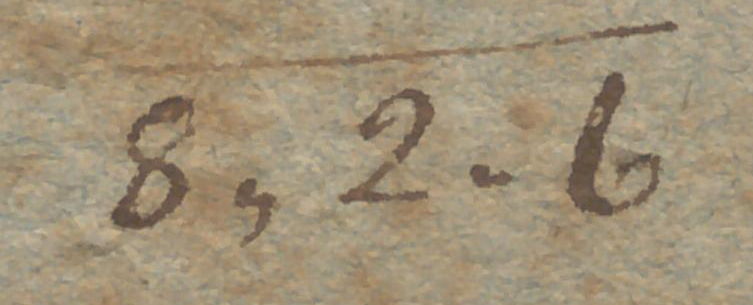8,2.6
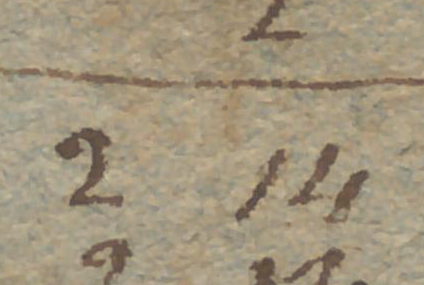2 14
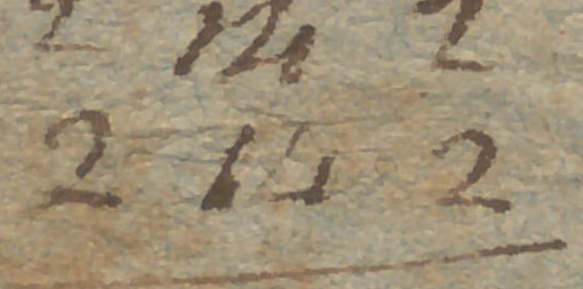2 14 2
